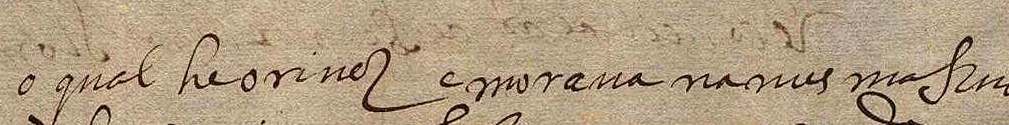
o qual he oriuez e moraua na mesma Rua
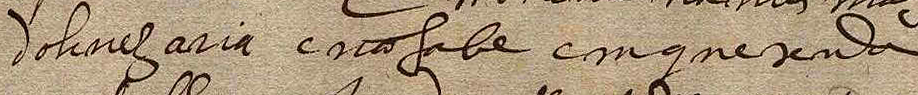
doliuezaria e nā sabe em que tenda
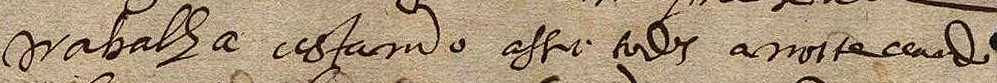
trabalha e estando assi todos a noite ceando
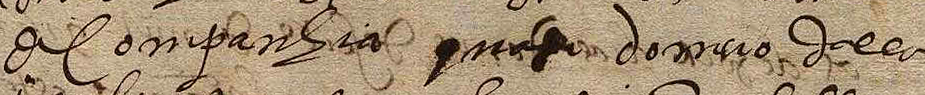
de Companhia quase do meio della
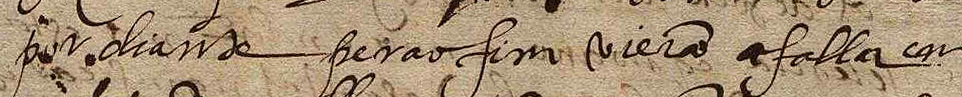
por diante pera o fim vierão a fallar em
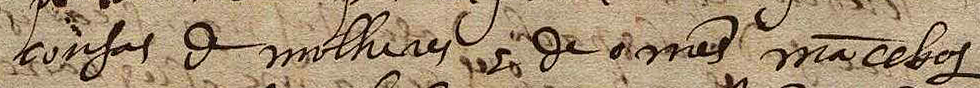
cousas de molheres E de omēs mācebos
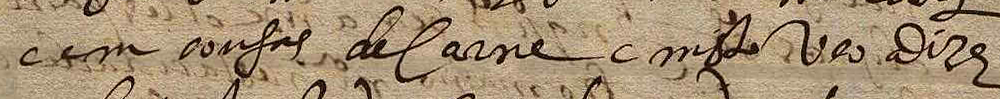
e em cousas de Carne e nisto veo a dizer
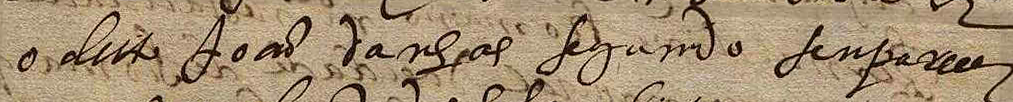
o ditto Joaõ danhas segundo seu parecer
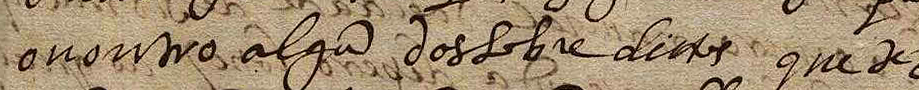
ou outro algū dos sobredittos que ter
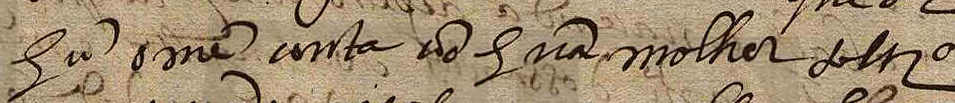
hū omē conta cō huā molher soltra
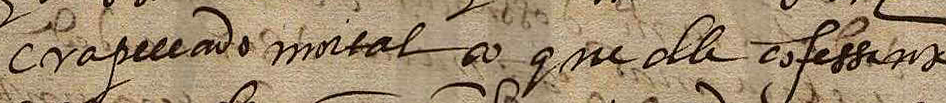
era peccado mortal ao que elle cōfessante
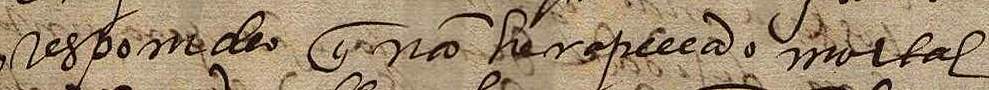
respomdeo q̄ naõ hera peccado mortal
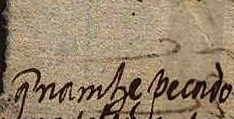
q̄ nam he pecado
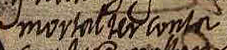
mortal ter conta
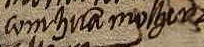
com huā molher
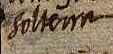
solteira
